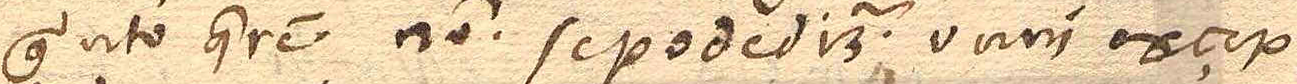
q̄nto q̄rē. nō. se pode diz̄. omnj exçep
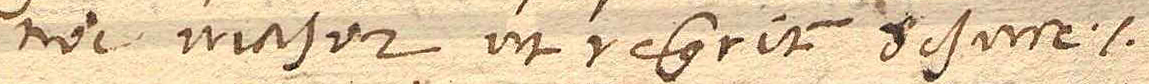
tioe major ut req̄rit̄ de Jure ./.
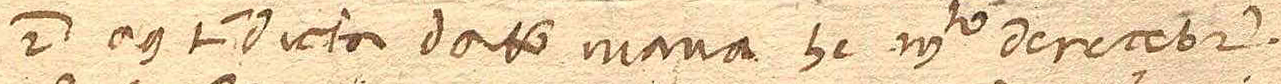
item a ꝯt̄dicta da Romana he mto de reçebr̄.
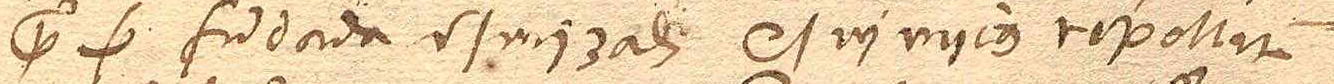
p̄o ꞩ fūdada ē Jmjzadj e jnjmjcꝯ repellat̄
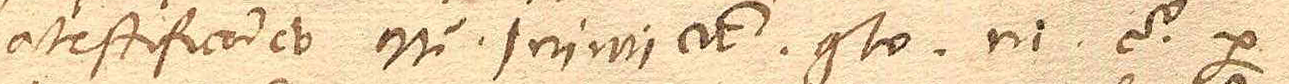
a testificādo ꝯt̄. Jnjmjcū. glo. ni. co. ꝑ
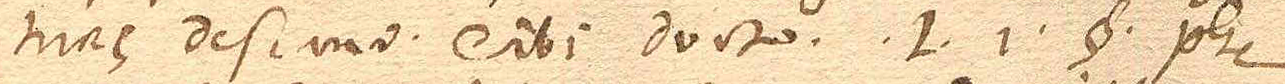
tuas desimo. e ibi docto. .L. i. §. p̄te
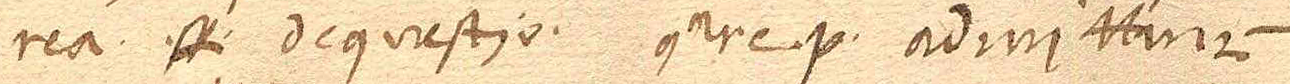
rea. .sꝑe de questjo. ꝯare. p. admjttant
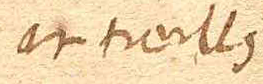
articullj
